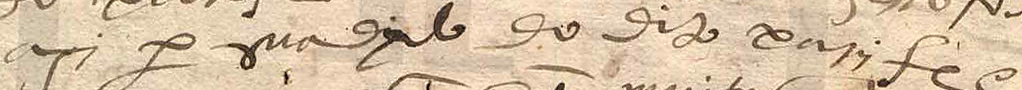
asi ꝑsuadydo do dito xarjfe e
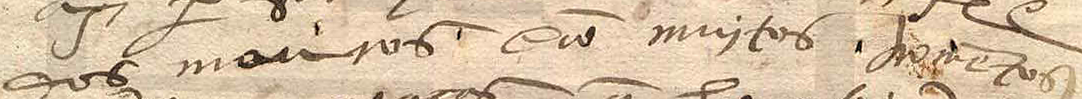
dos mouros e c̄o mujtos tromētos
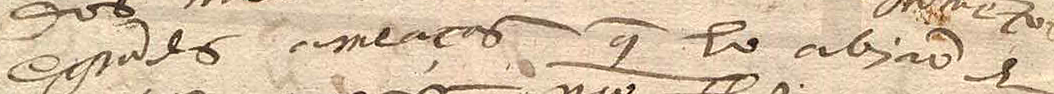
e grādes ameaças q̄ ho avjão de
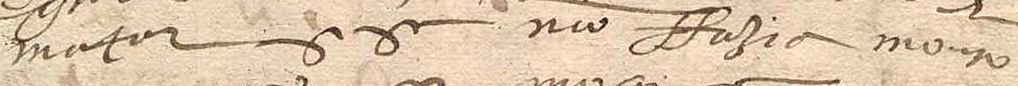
matar se se não ffazia mouro
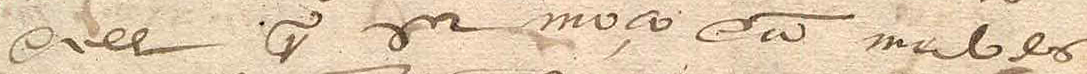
e elle p̄o ser moço e c̄o medo dos
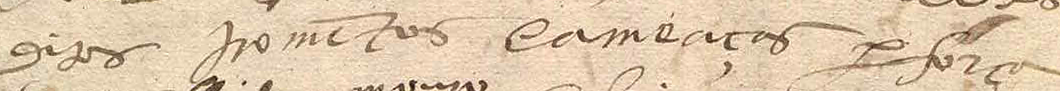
ditos tromētos e ameaças ꝑ força
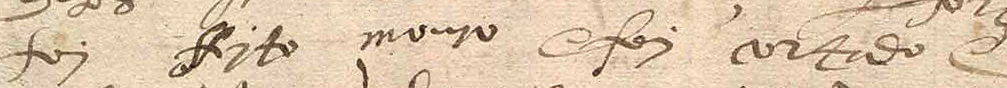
foj ffejto mouro e foy cortado e
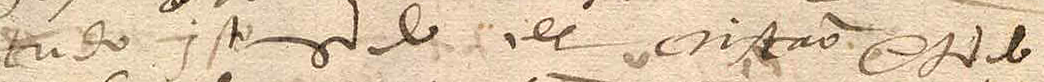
tudo jsto sēdo elle cristaõ e tēdo
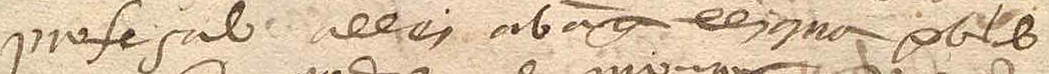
profesado a llei avāgelljqua e vēdo
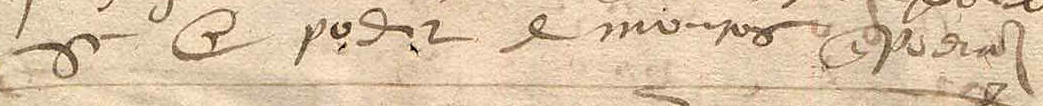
se ē poder de mouros q̄ podiaõ
